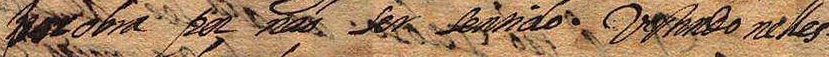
por obra por naõ ser sentido vestindo nelles
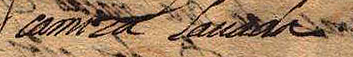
camiza lauada.
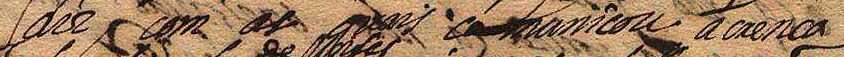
diz, com as quais cōmunicou a crença
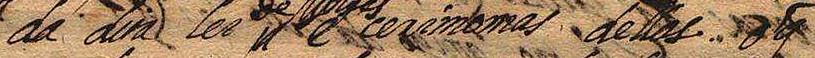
da dita lei de Moises e cerimonias dellas o q̄
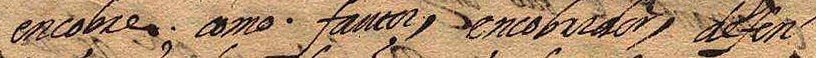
encobre como fautor, encobridor, defen
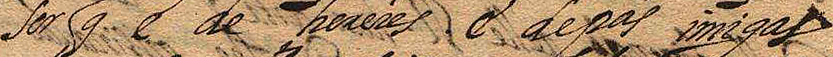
sor q̄ e de hereies e de pas imigas
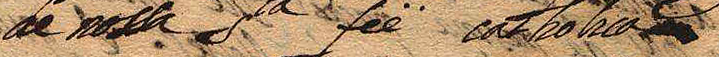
de nossa sta fee catholica
